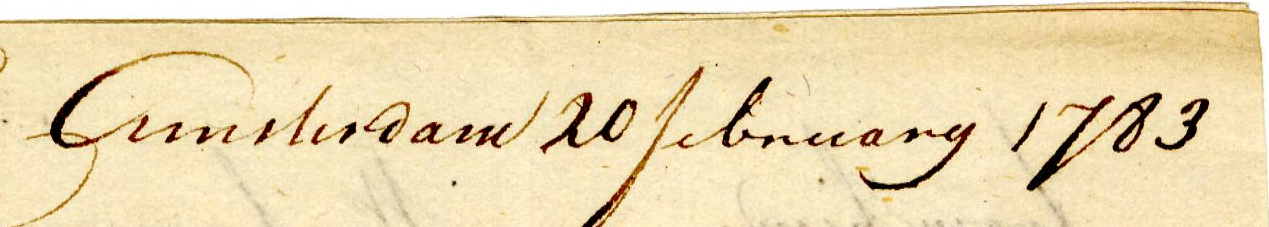Amsterdam 20 February 1783
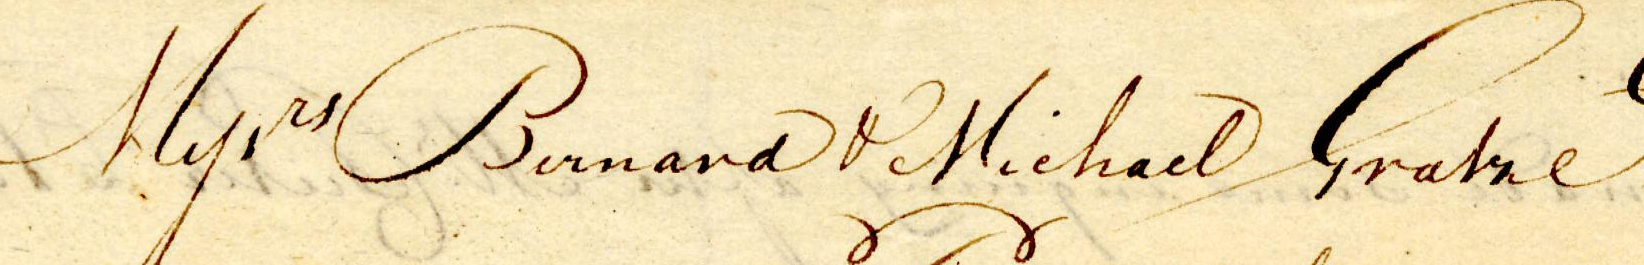Mess^rs Bernard & Michael Gratz
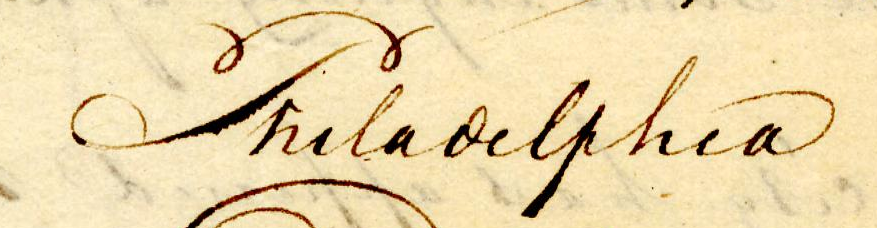Philadelphia
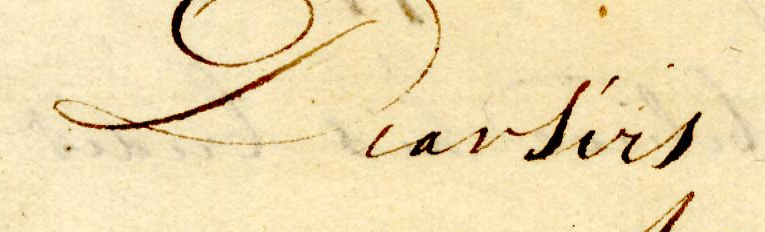Dear Sirs
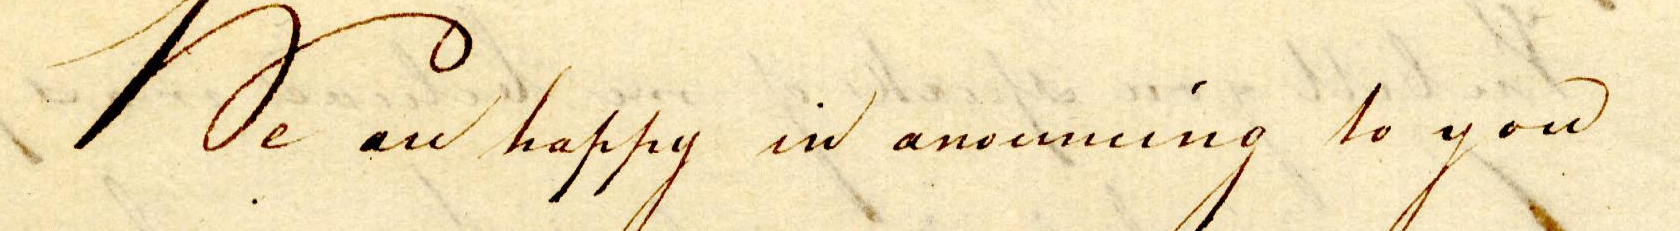We are happy in anserring to you
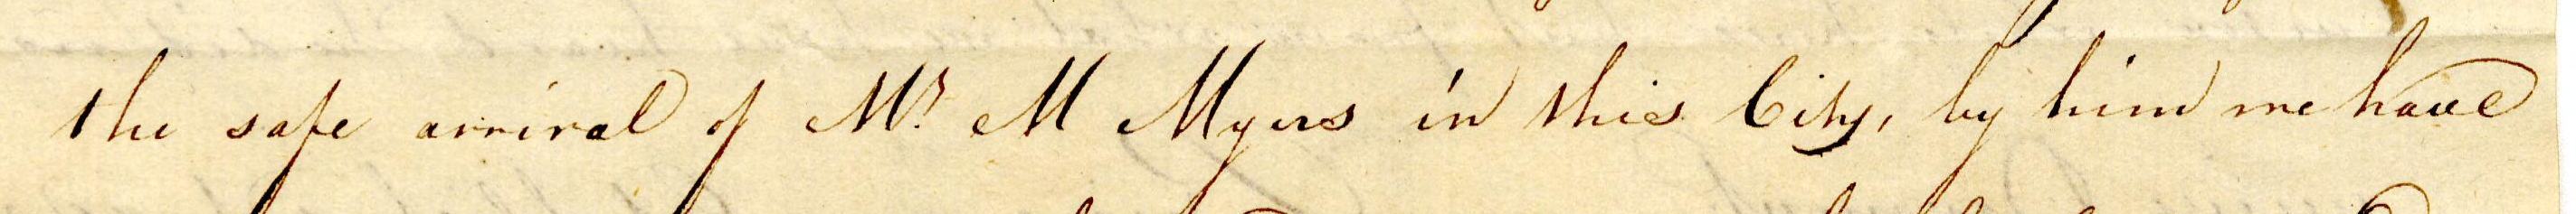the safe arrival of M^r. M Myers in this City, by him we have
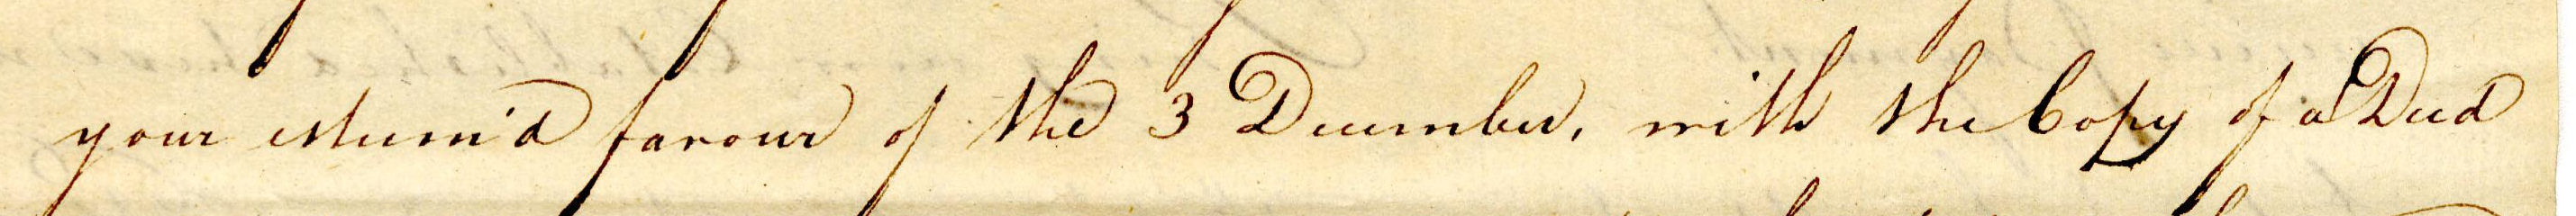your return'd favour of the 3 December with the Copy of a Deed
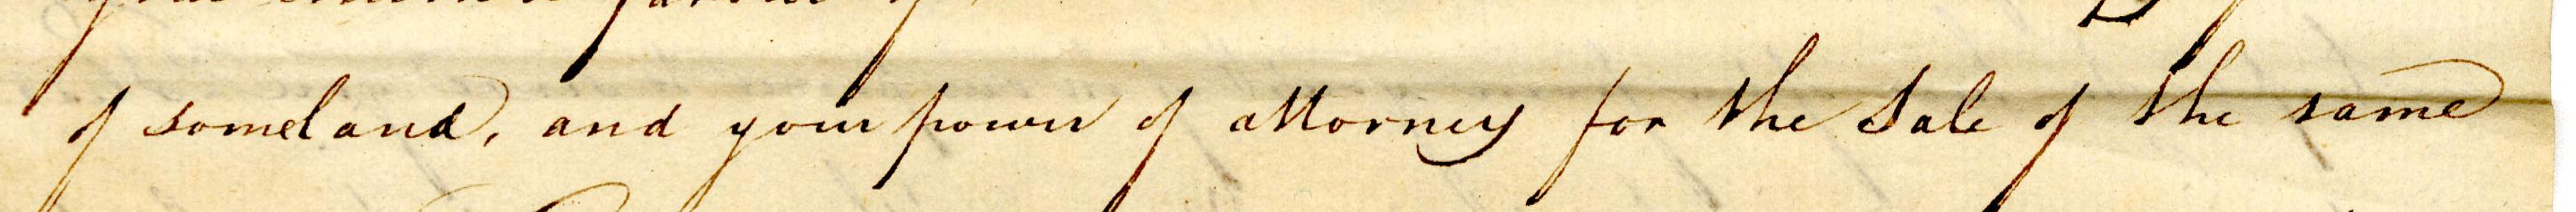of someland and your power of attorney for the Sale of the same
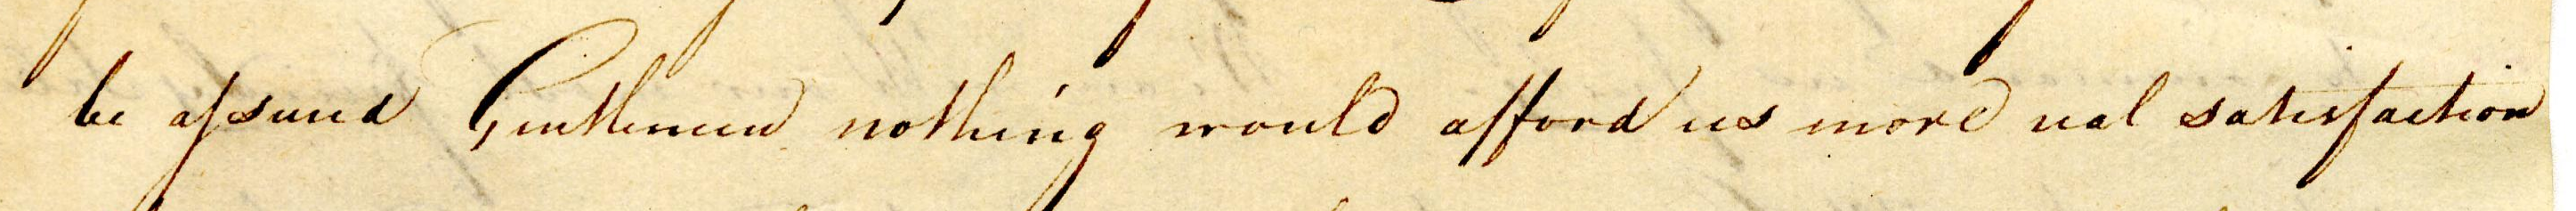be assurd Gentlemen nothing would afford us more real satisfaction
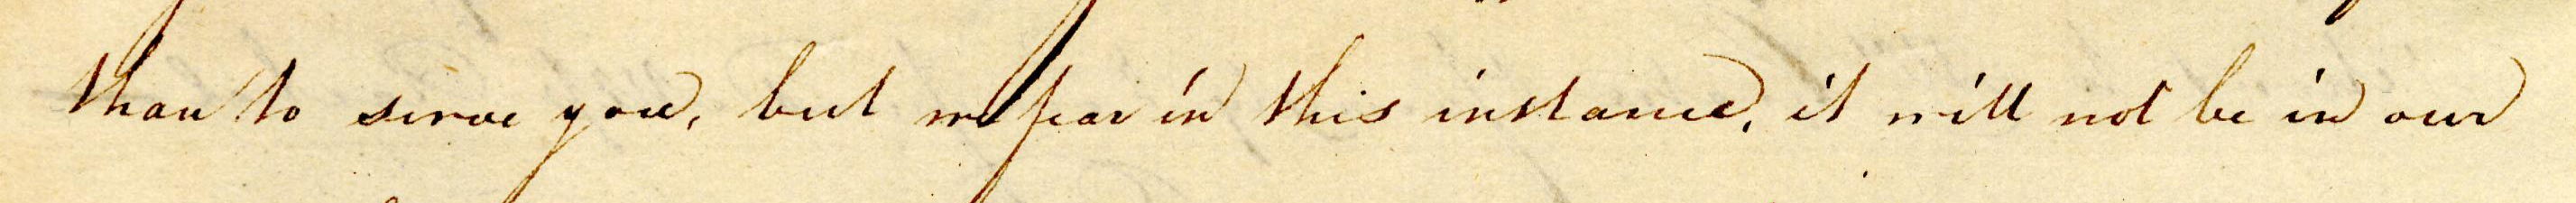than to serve you, but my fear in this instance, it will not be in our
